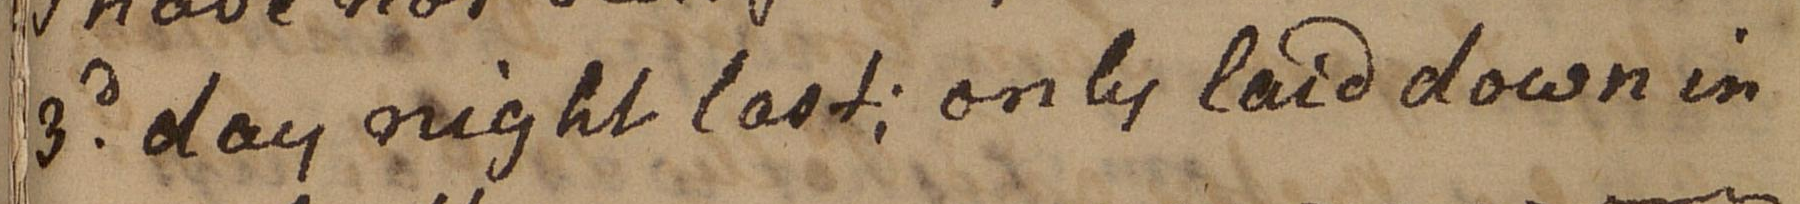3^d. day night last; only laid down in
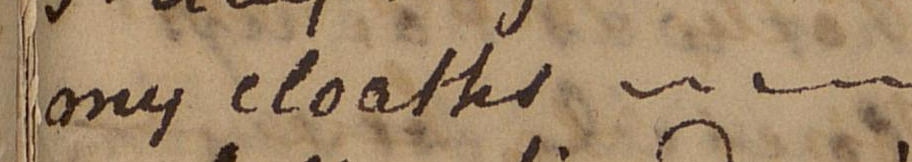my cloaths--
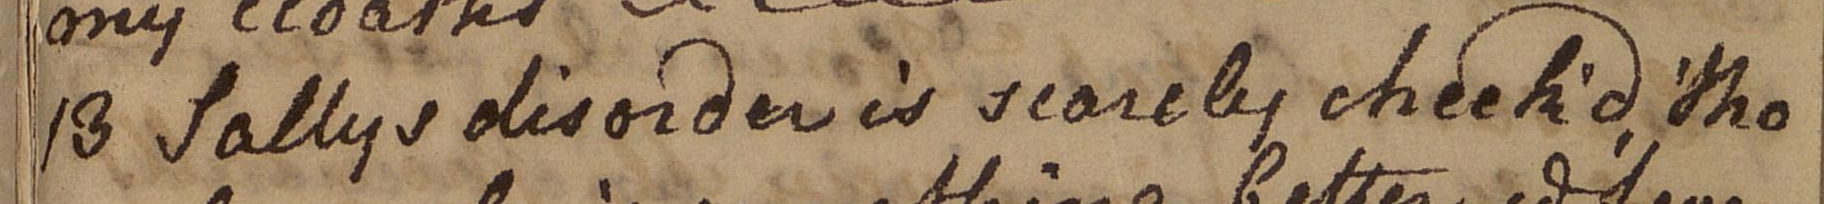13 Sallys disorder is scarcly check'd ,'tho
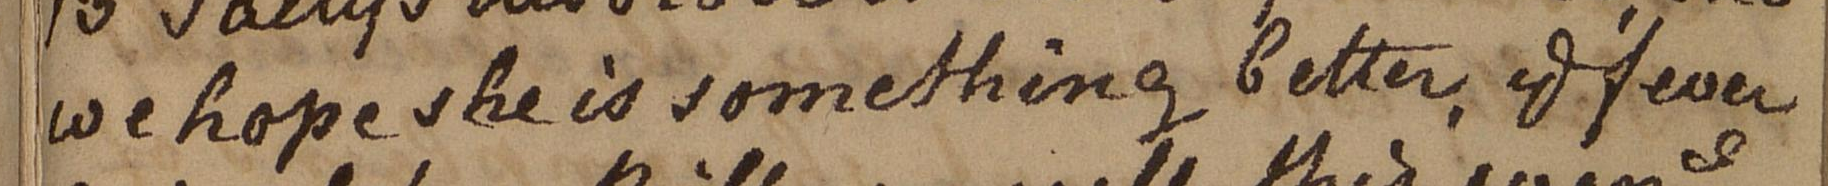we hope she is something better, y^e fever
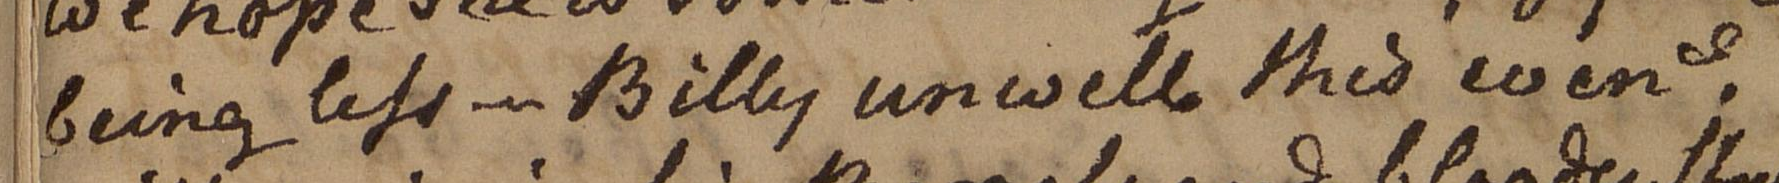being less- Billy unwell this even^g.
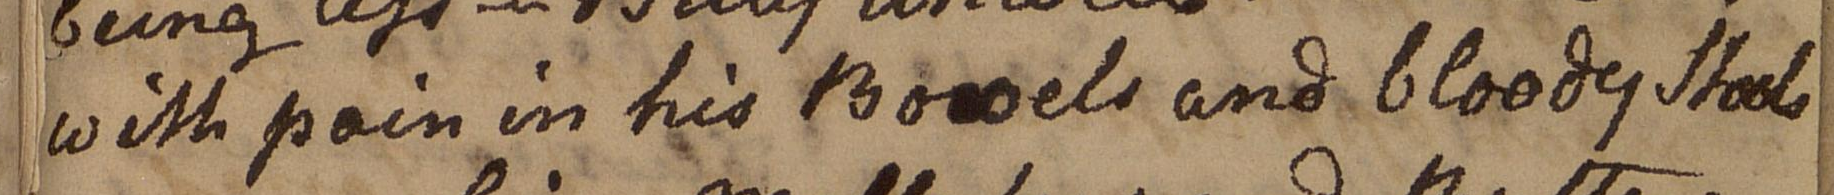with pain in his Bowels and bloody Stools
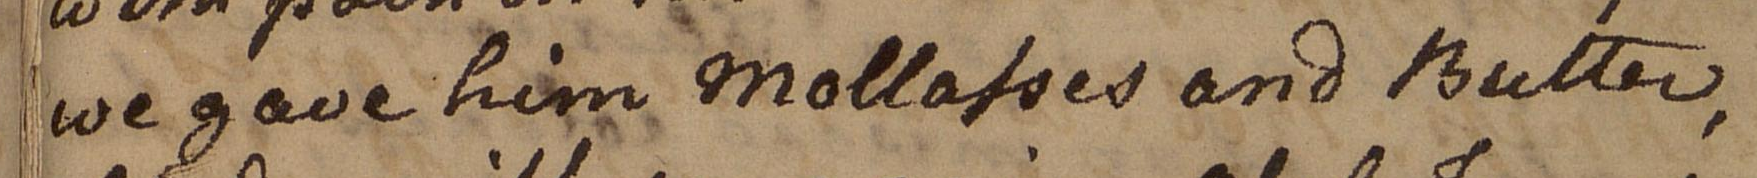we gave him Mollasses and Butter,
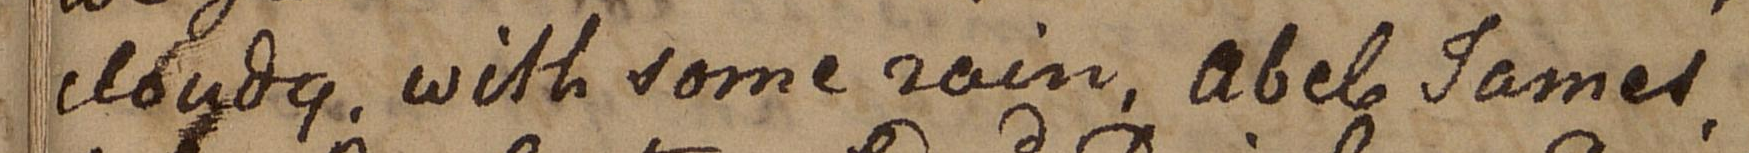cloudy, with some rain, Abel James,
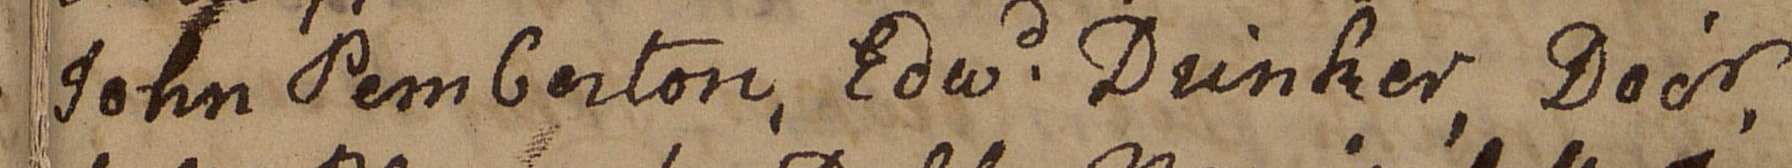John Pemberton, Edw^d. Drinker Doc^r,
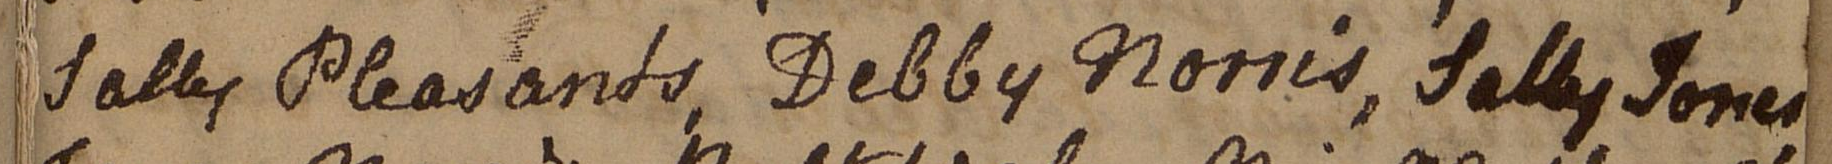Sally Pleasants, Debby Norris, Sally Jones,
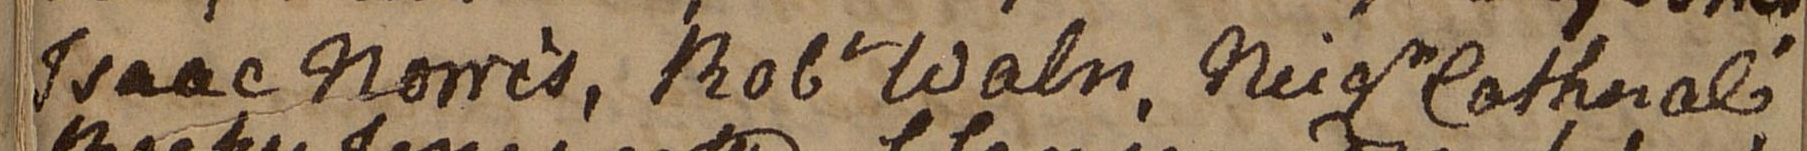Isaac Norris, Rob^t Waln, Neig^r Catheral,
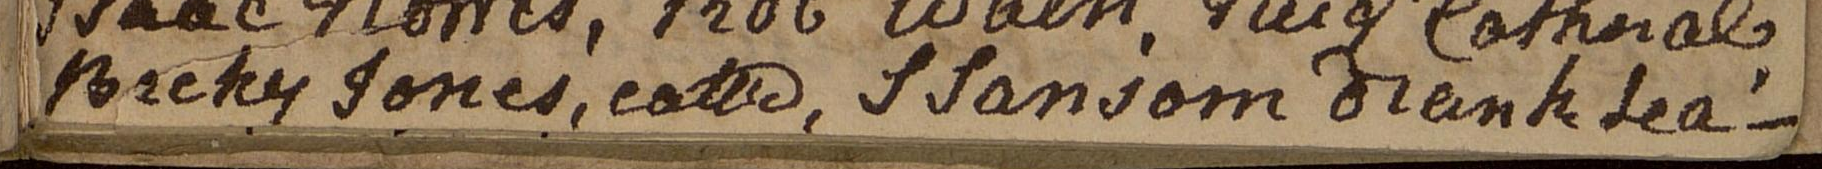Becky Jones, call'd, S Sansom drank tea-
